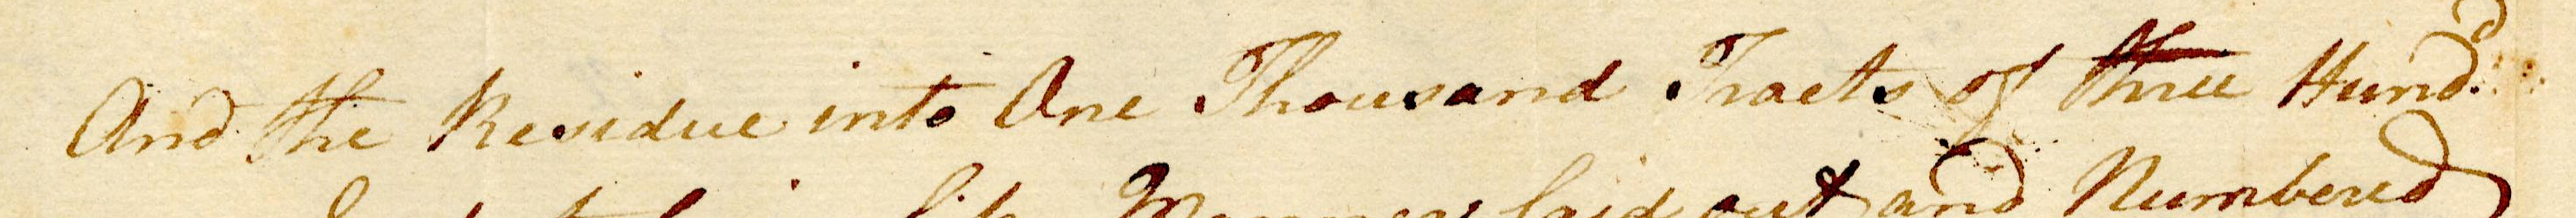And the Residue into One Thousand Tracts of three Hund^d.
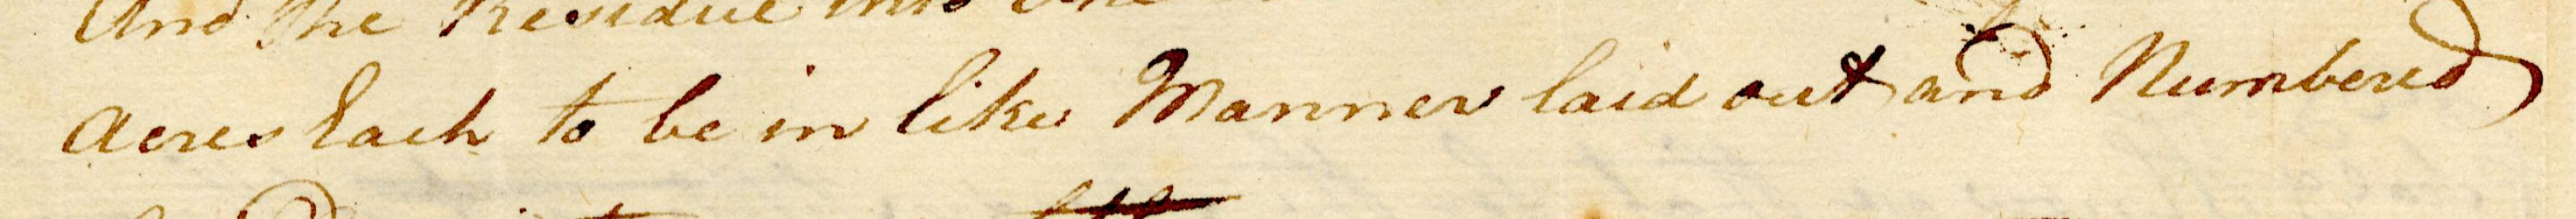acres Each to be in likes Manner laid out and Numbered
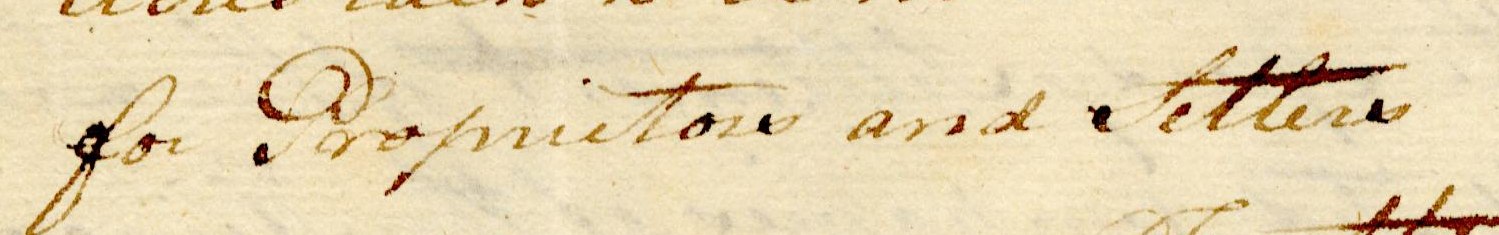for Proprietors and Setters
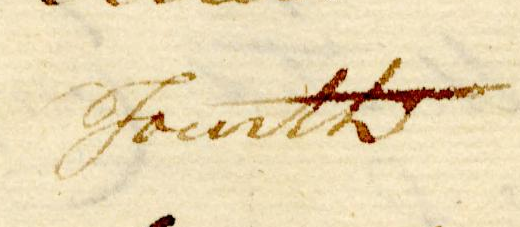Fourth
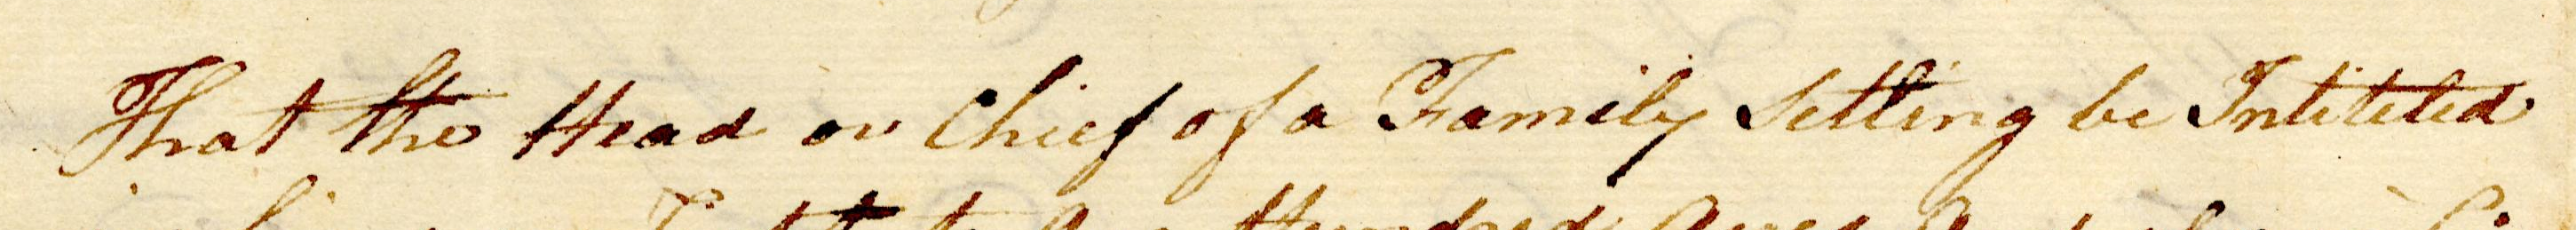That the Head or Chief of a Family Setling be Intitited
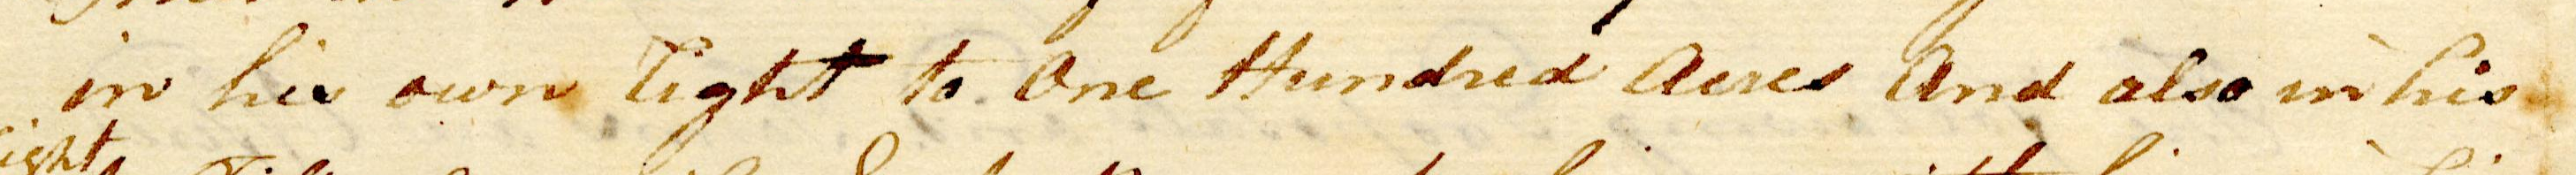in his own right to One Hundred Acres, And also in his
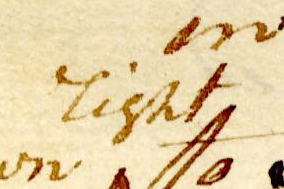right
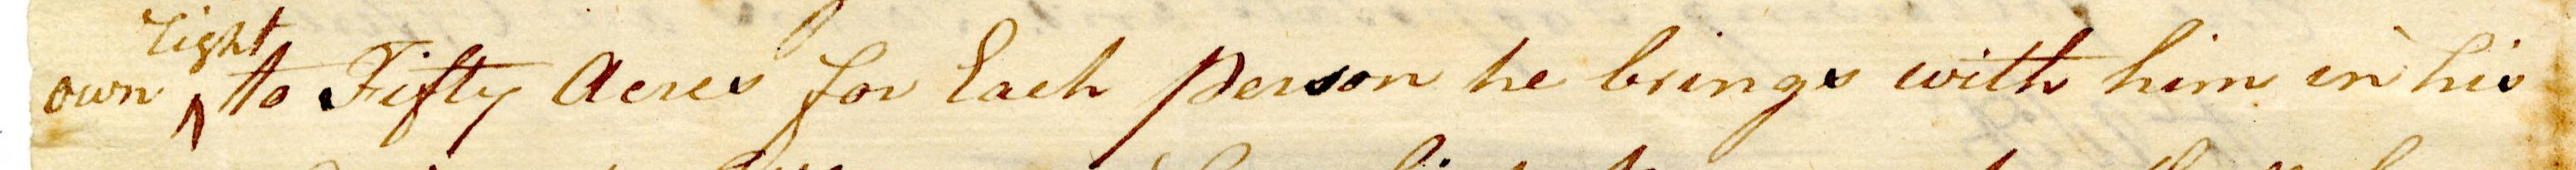own ^ to Fifty Acres for Each person he brings with him in his
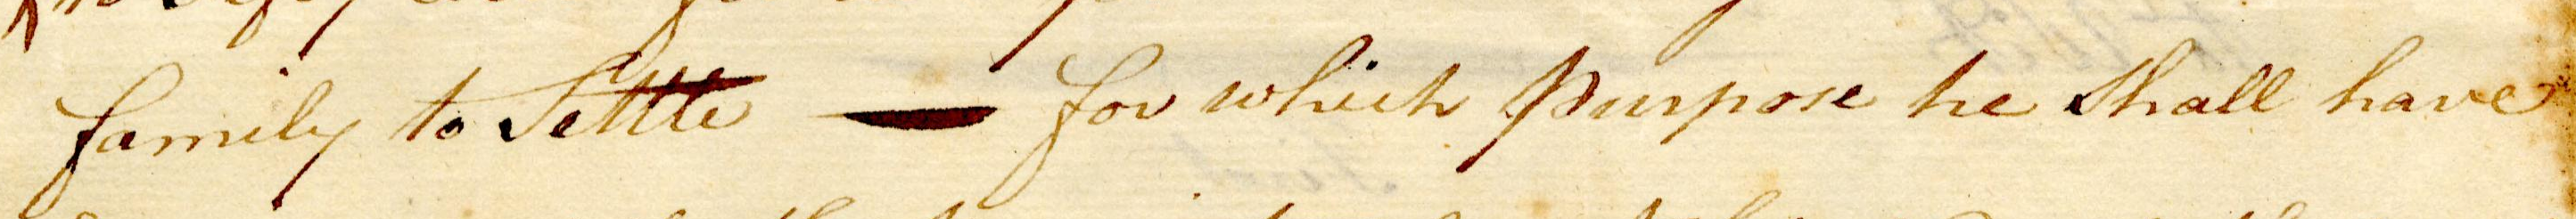family to Settle- for which purpose he shall have
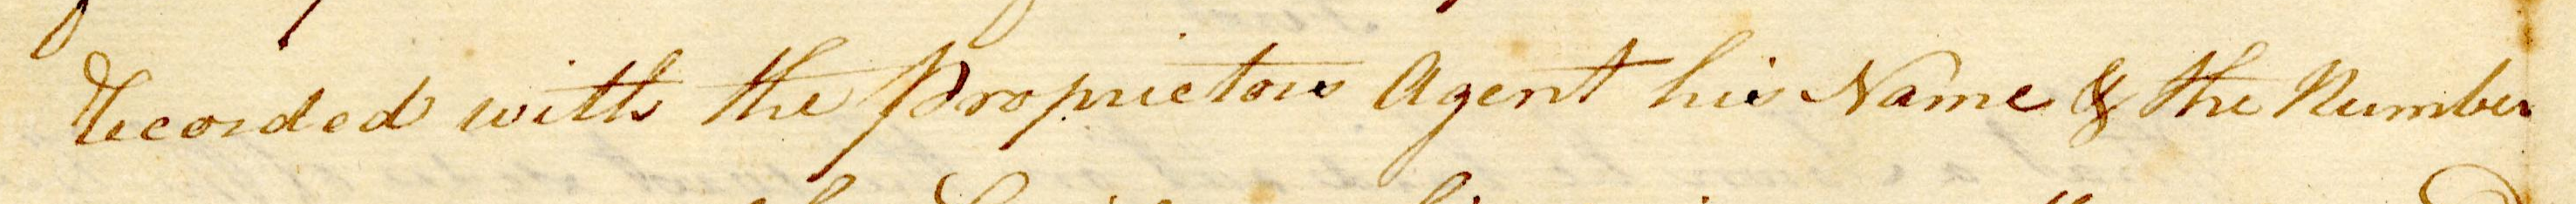recorded with the Proprietors agent his Name & the number
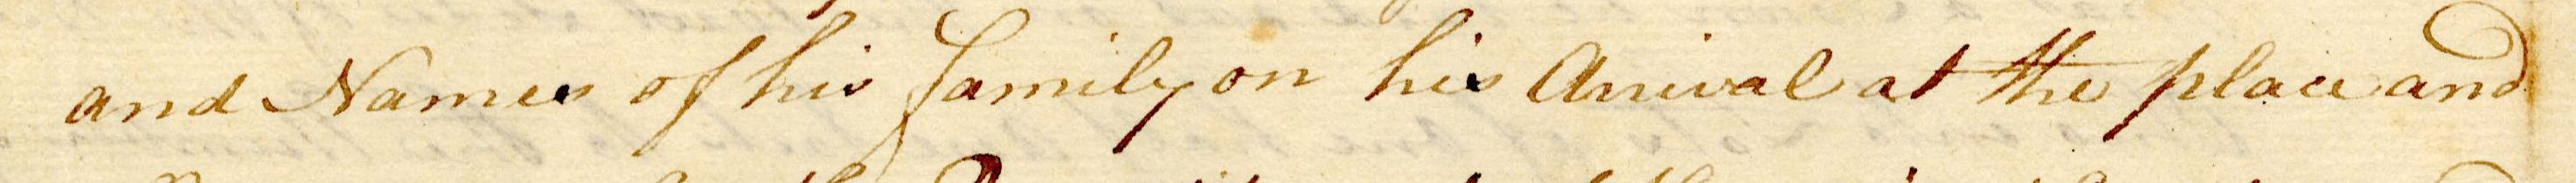and Names of his family on his Arrival at the place and
